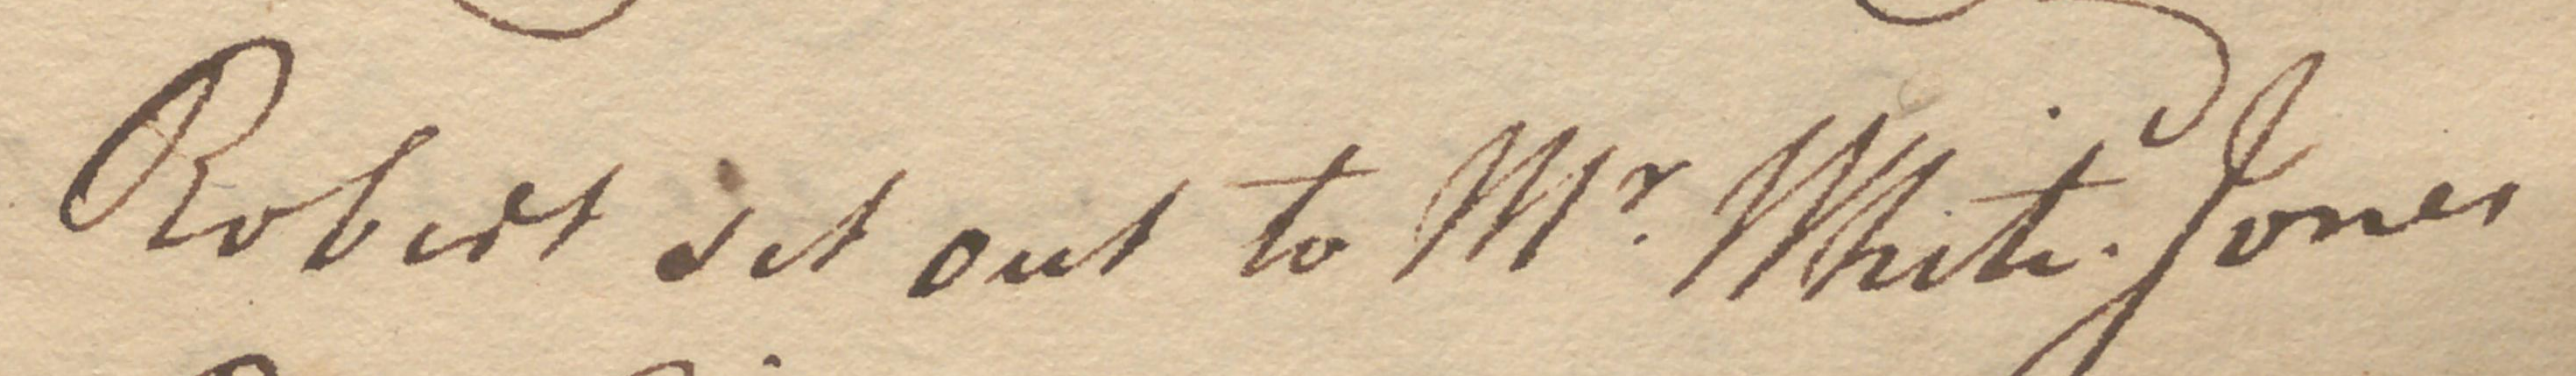Robert set out to M^r. Whit^d. Jones
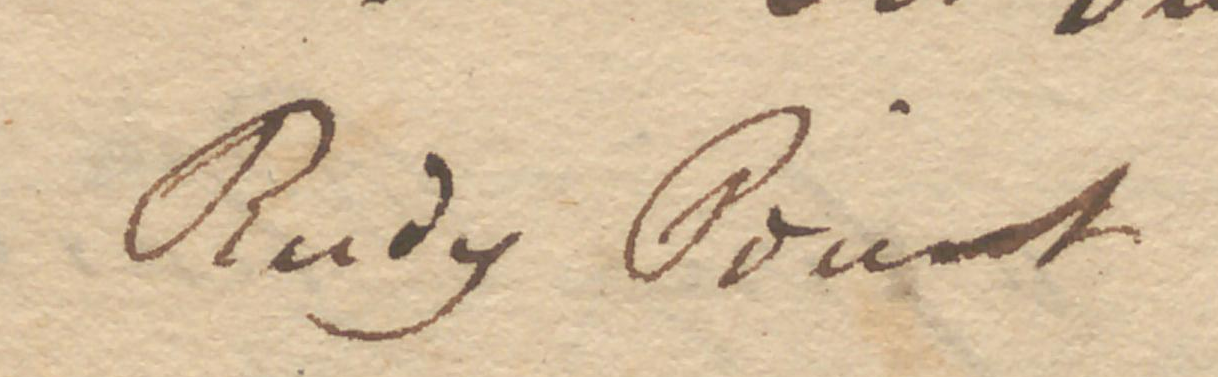Reedy Pount
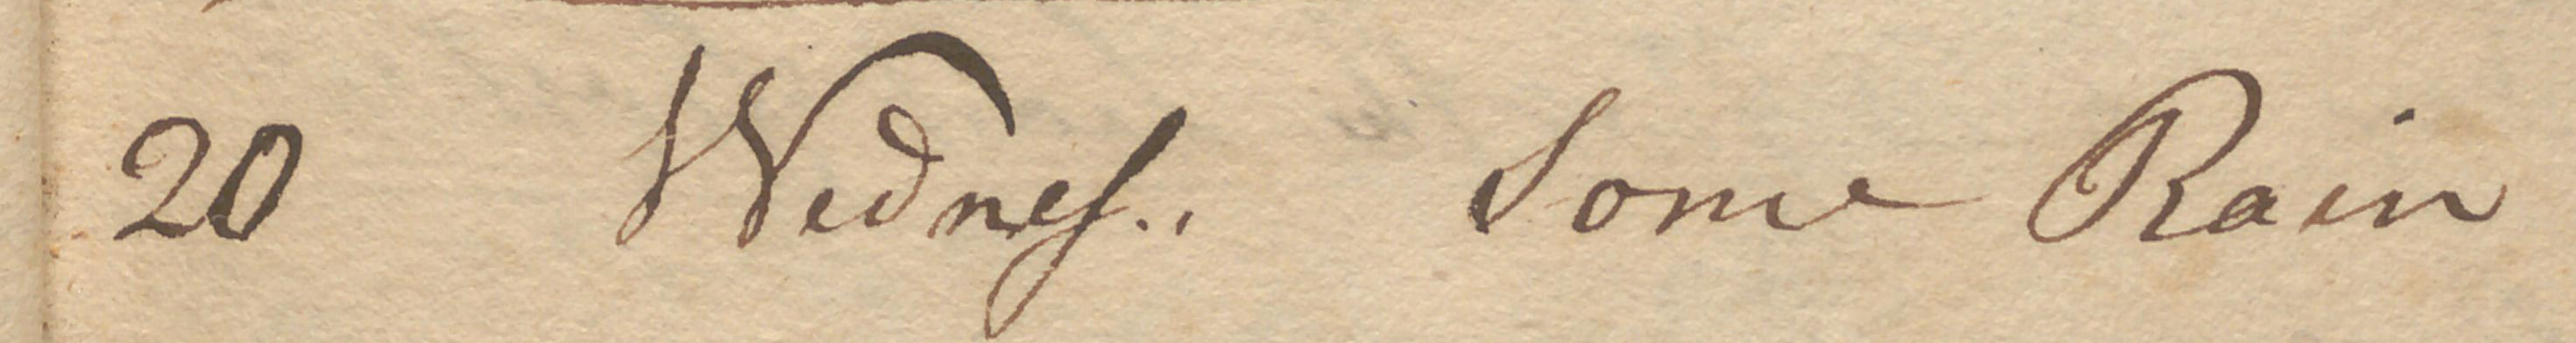20 Wednes. Some Rain
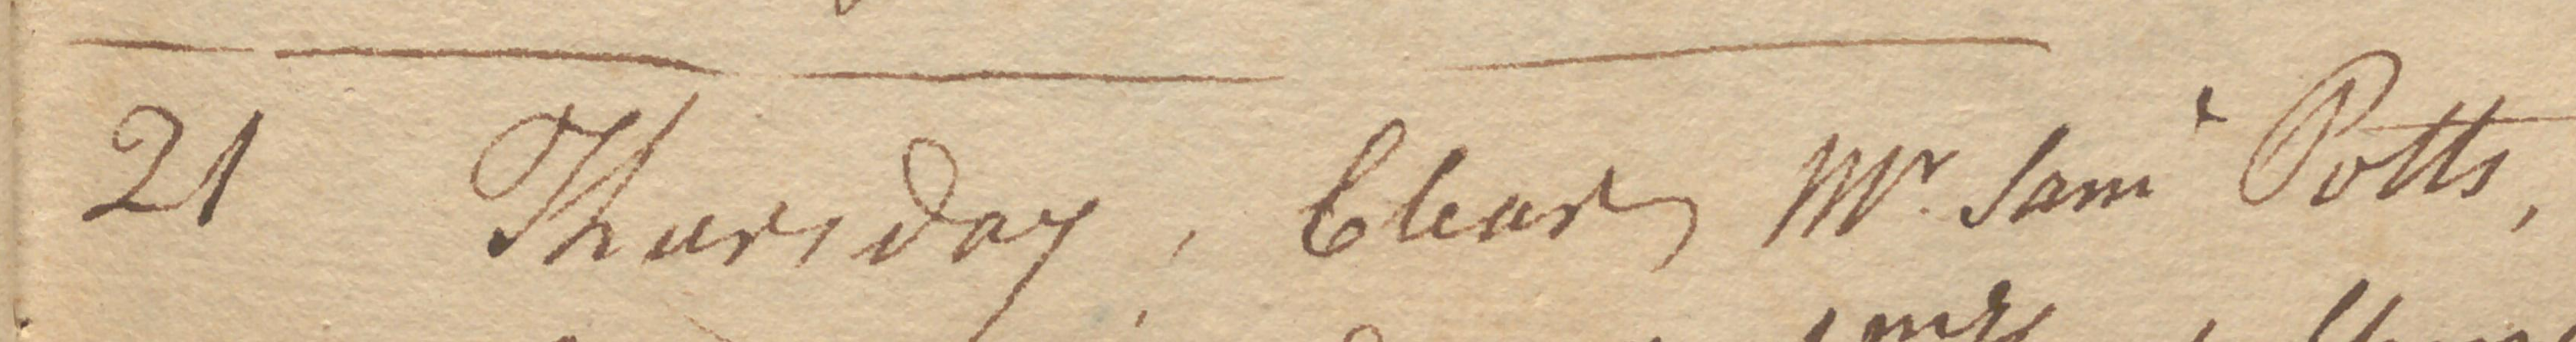21 Thursday. Clear M^r. Sam Potts
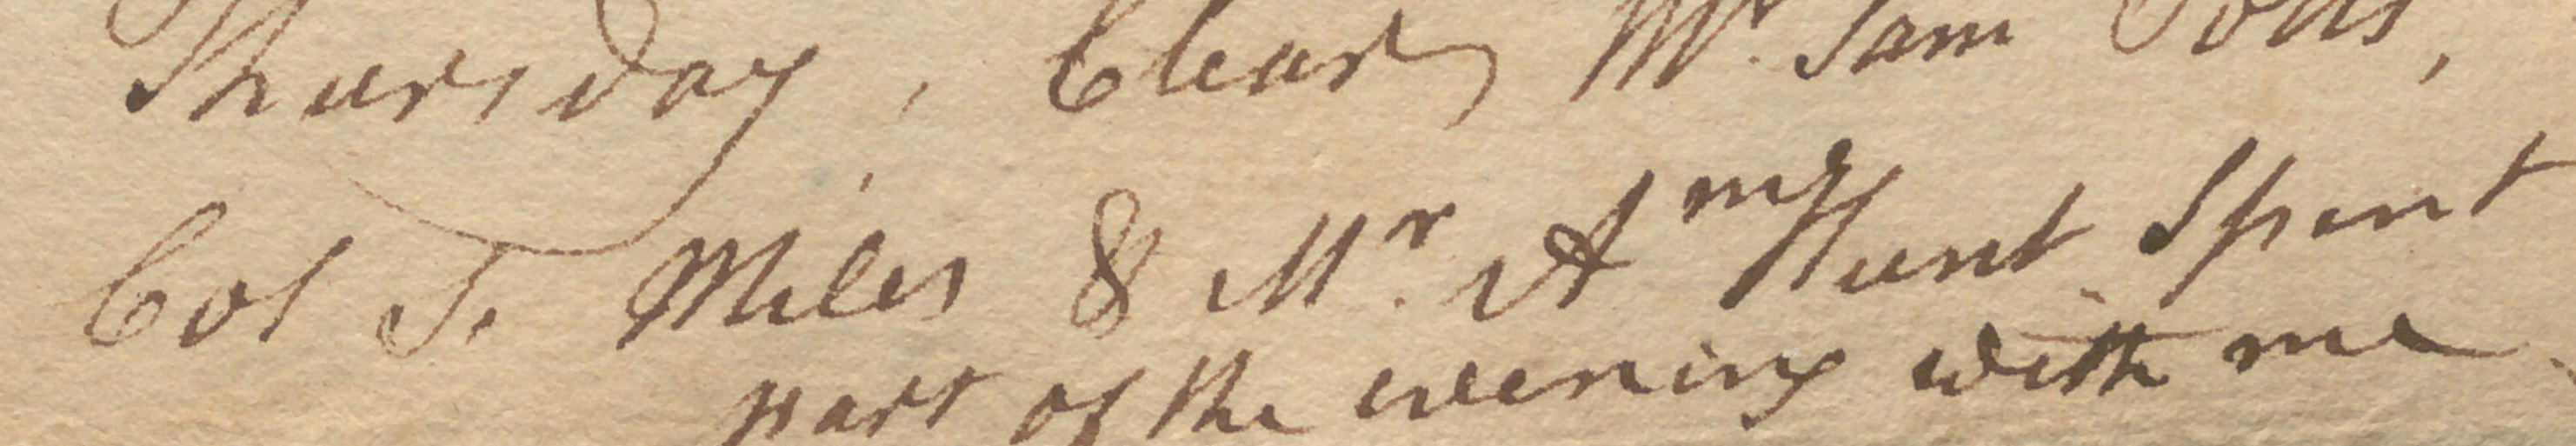Cot S. Miles & M^r. A^m Hunt spent
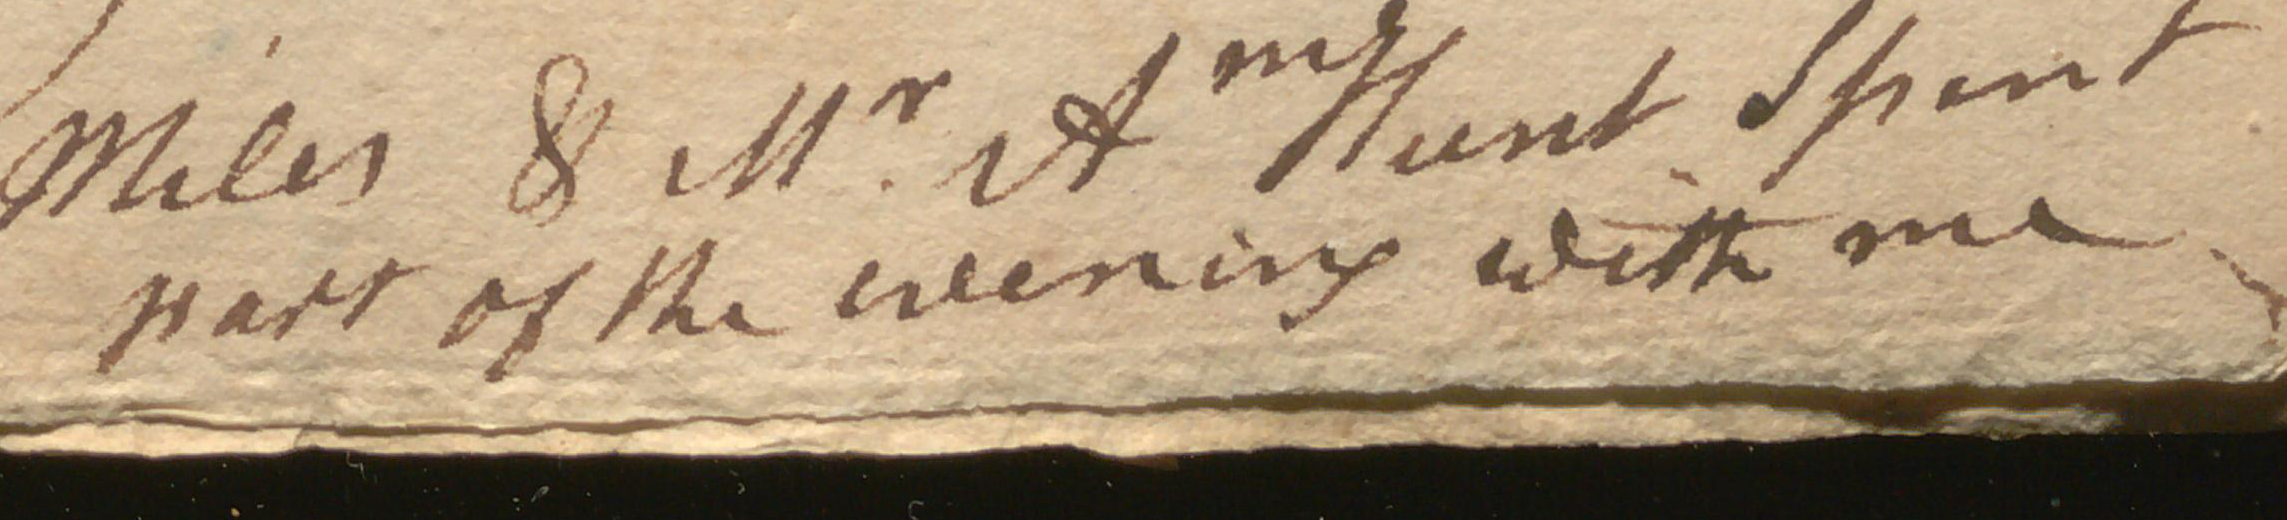part of the evening with me
